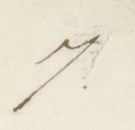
7.
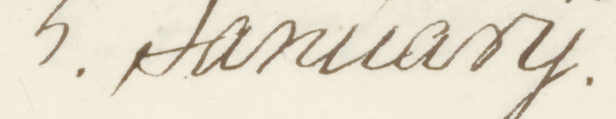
5. Januarij.
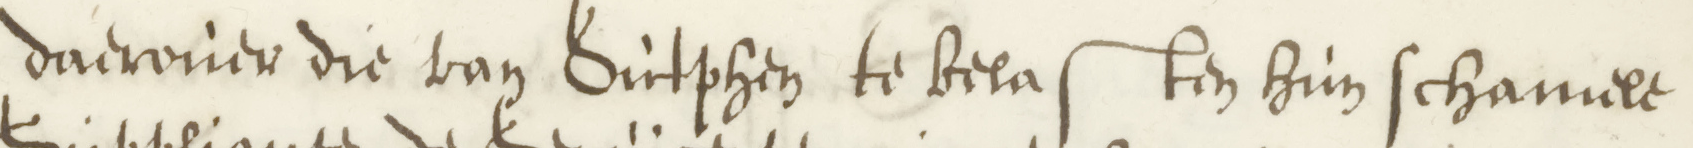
daervuer die van Sutphen te belasten hun schamele
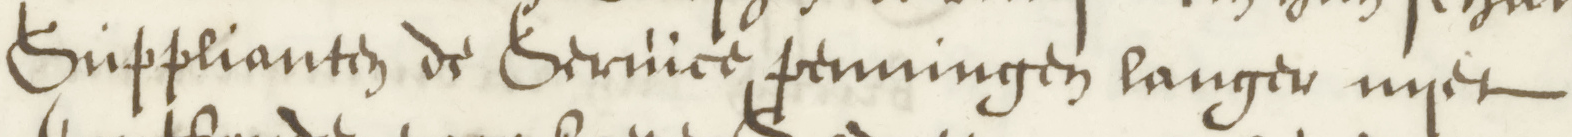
Supplianten de Seruice penningen langer nyet
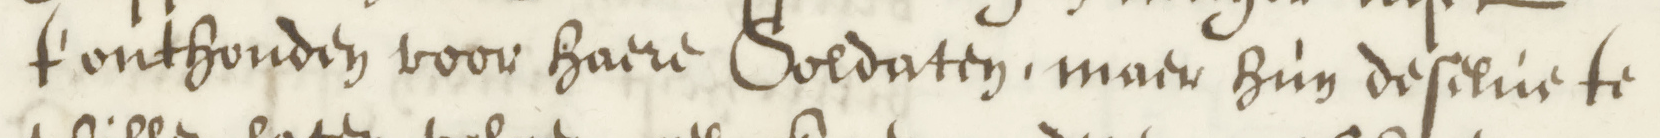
t'onthouden voor haere Soldaten, maer hun deselue te
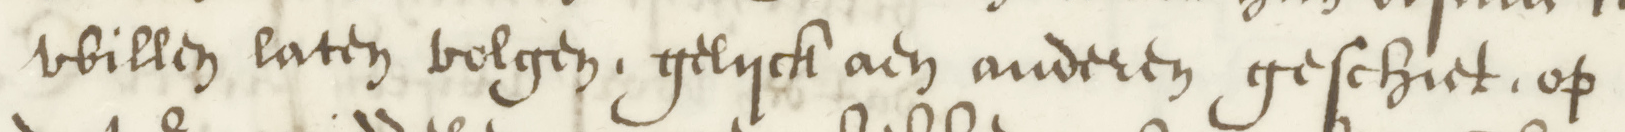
willen laten volgen, gelyck aen anderen geschiet, op
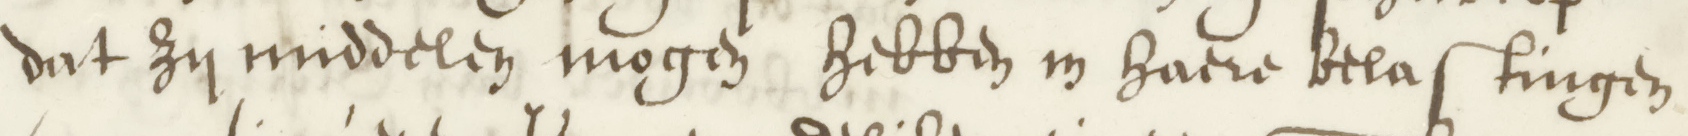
dat zy middelen mogen hebben in haere belastingen
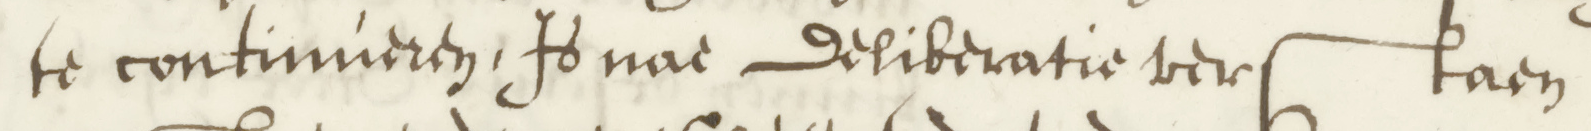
te continueren, Is nae Deliberatie verstaen
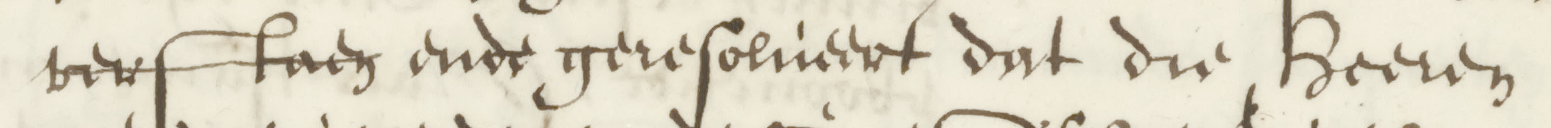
verstaen ende geresolueert dat die heeren
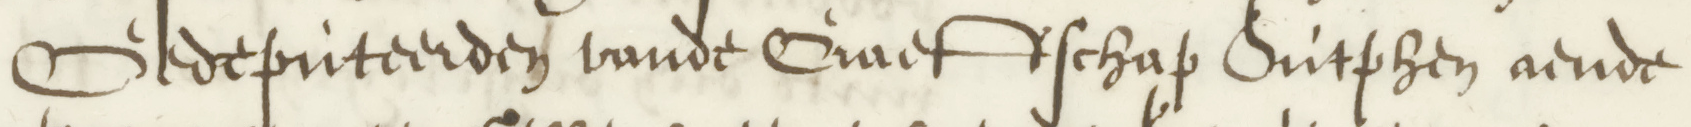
Gedeputeerden vande Graefschap Sutphen aende
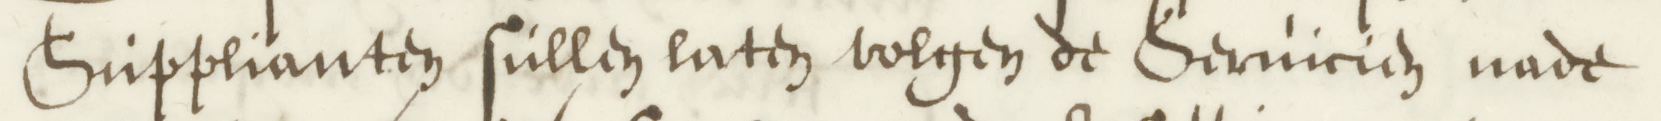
Supplianten sullen laten volgen de Seruicien nade
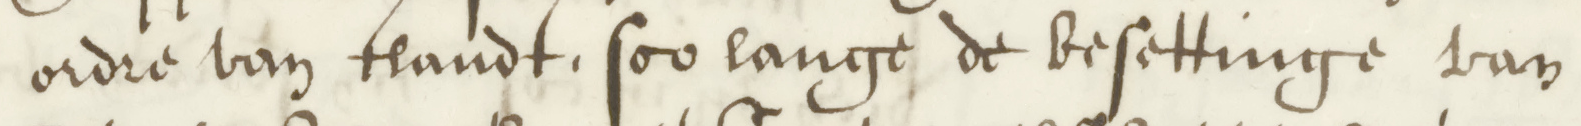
ordre van tlandt, soo lange de besettinge van
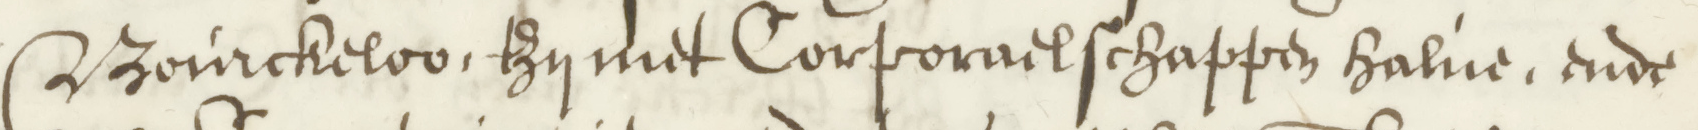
Bourckeloo, tzy met Corporaelschappen halue, ende
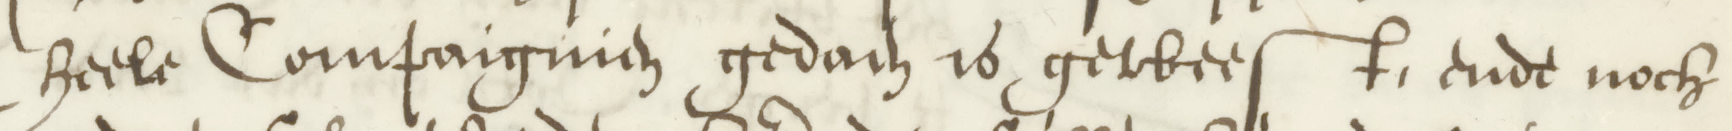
heele Compaignien gedaen is geweest, ende noch
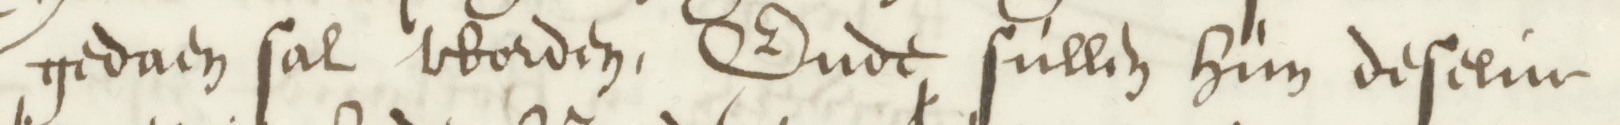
gedaen sal worden. Ende sullen hun deselue
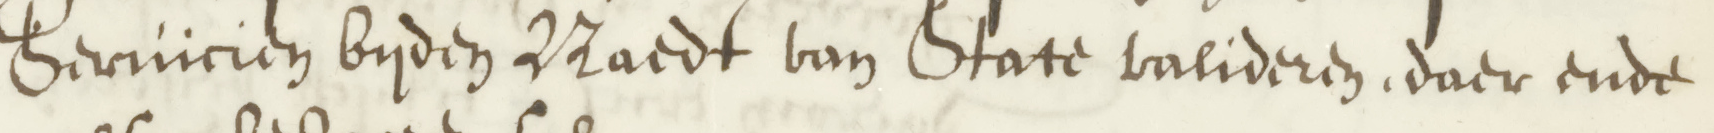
seruicien bijden Raedt van State valideren, daer ende
